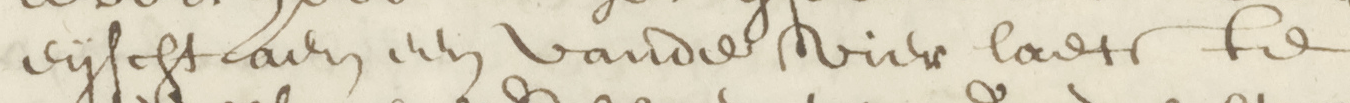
eijscht aen een vande vier laetste
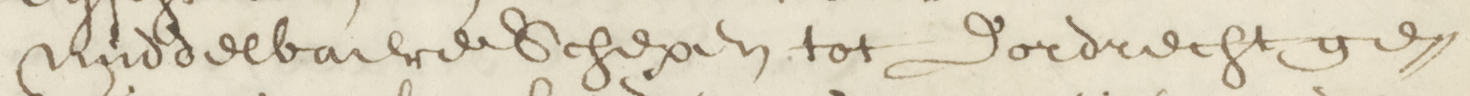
middelbaere Schepen tot Dordrecht ge„
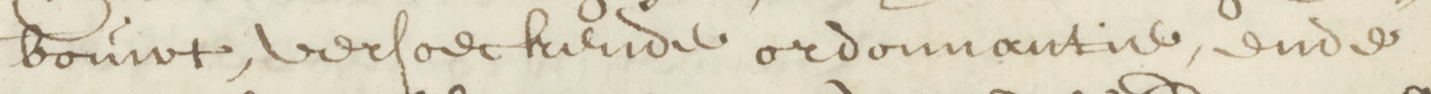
bouwt, versoeckende ordonnantie, ende
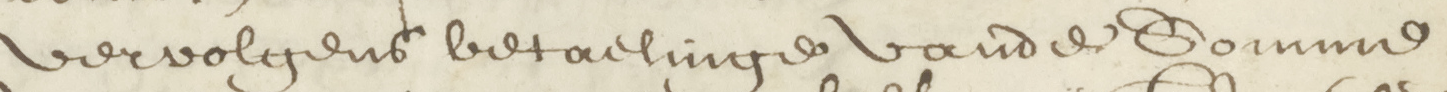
vervolgens betaelinge vande Somme
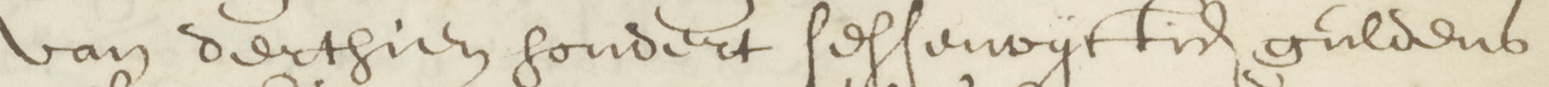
van derthien hondert sessenvijftich guldens
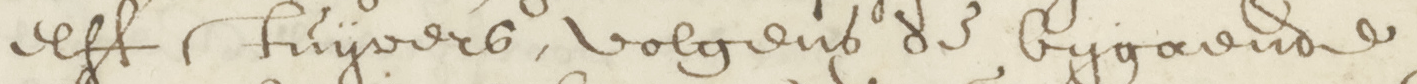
elff stuijvers, volgens de bijgaende
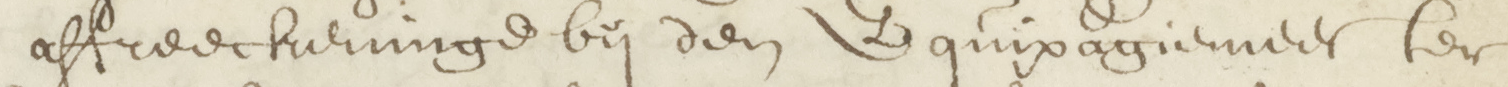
affreeckeninge bij den Equipagiemeester
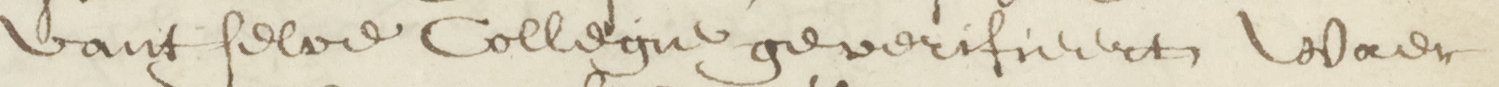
vant selve Collegie geverifieert, Waer
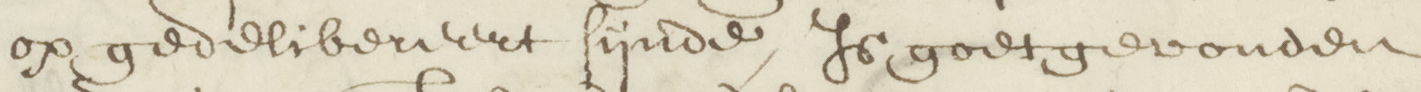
op gedelibereert sijnde, Is goetgevonden
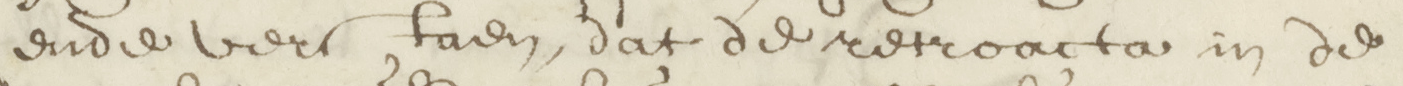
ende verstaen, dat de retroacta in de
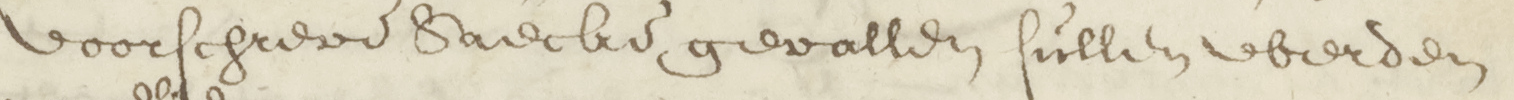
voorschreve Saecke gevallen sullen werden
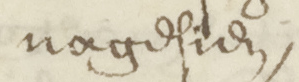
nagesien.
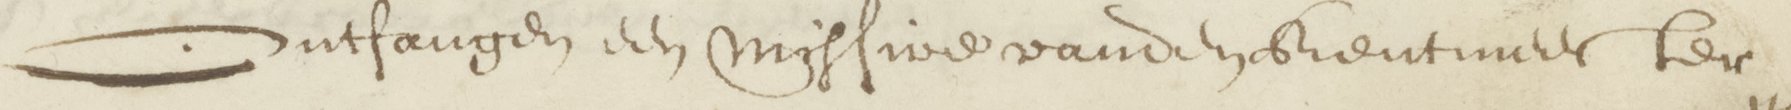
Ontfangen een missive vanden rentmeester
